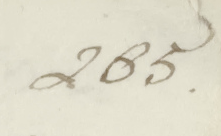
285.
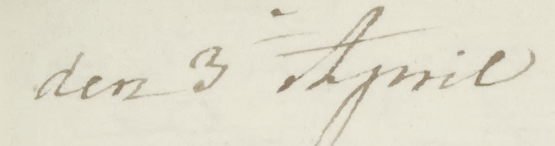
den 3 April
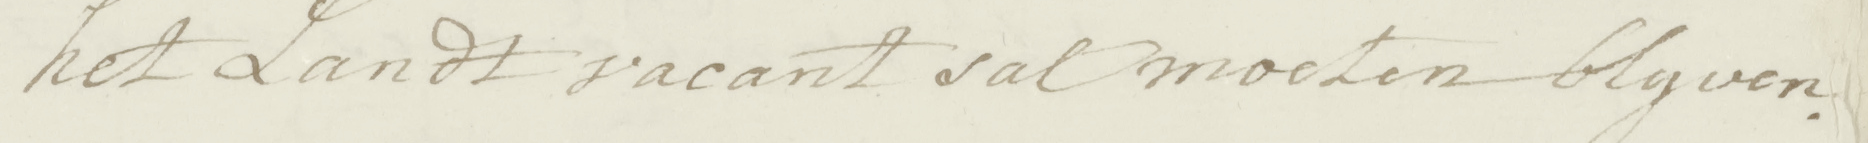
het Landt vacant sal moeten bljven.
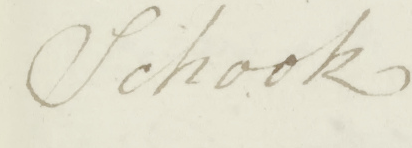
Schook
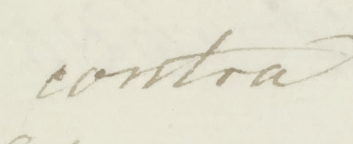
contra
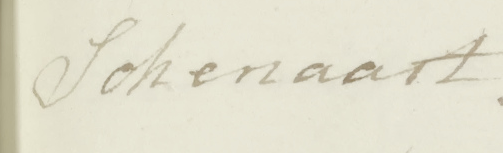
Schenaart
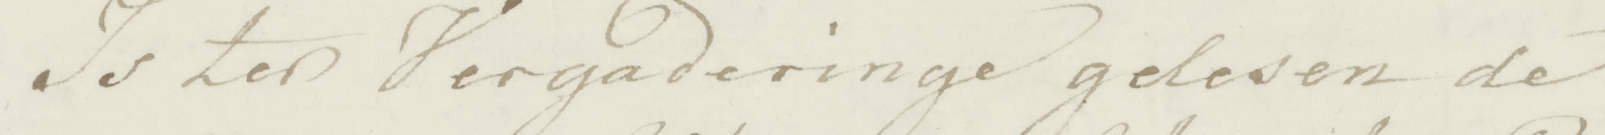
Is ter Vergaderinge gelesen de
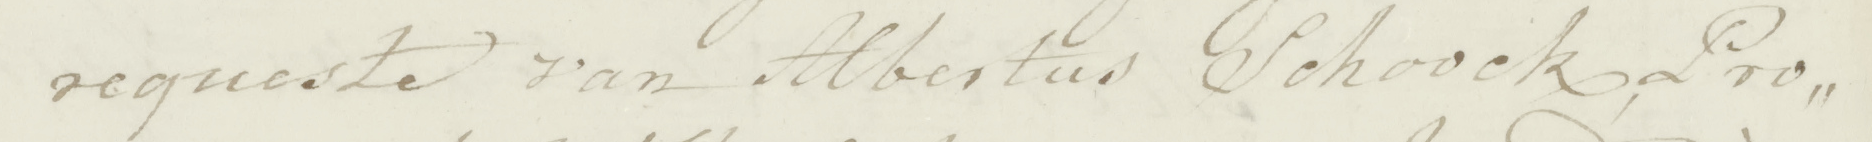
requeste van Albertus Schoock, Pro„
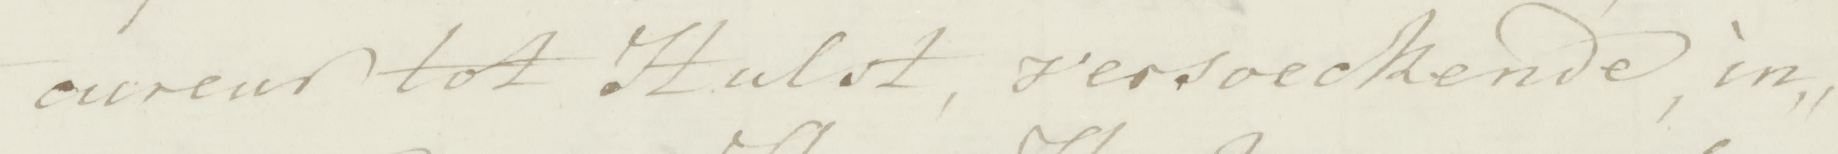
cureur tot Hulst, versoeckende in„
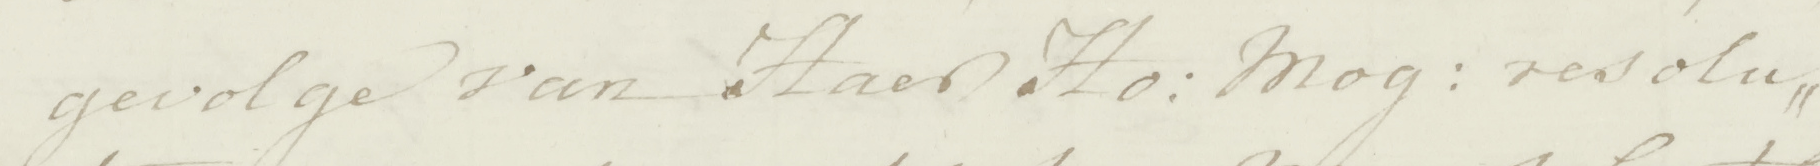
gevolge van Haer Ho: Mog: resolu„
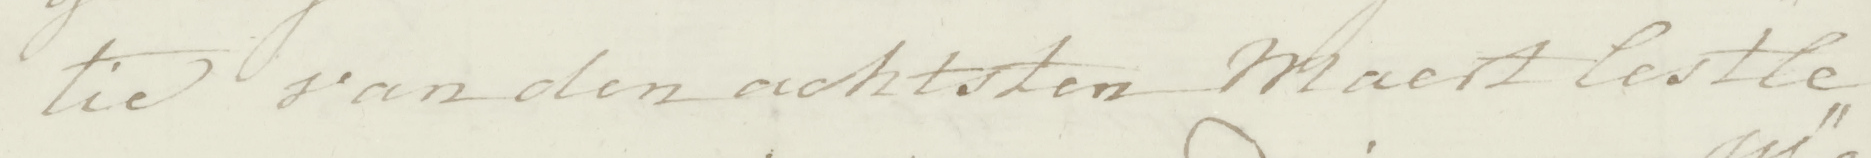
tie van den achtsten Maert lestle„
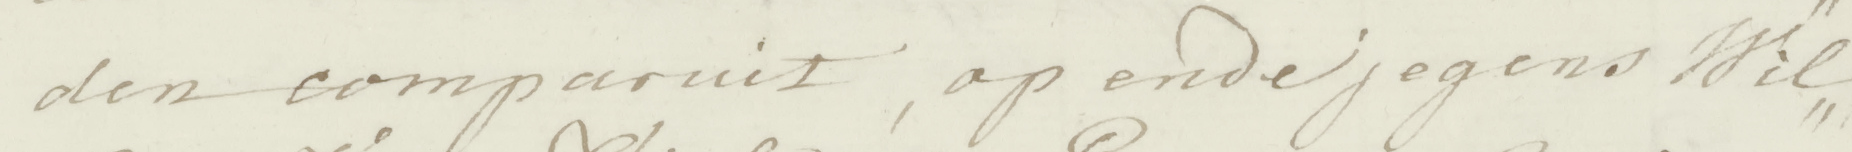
den comparuit, op ende jegens Wil„
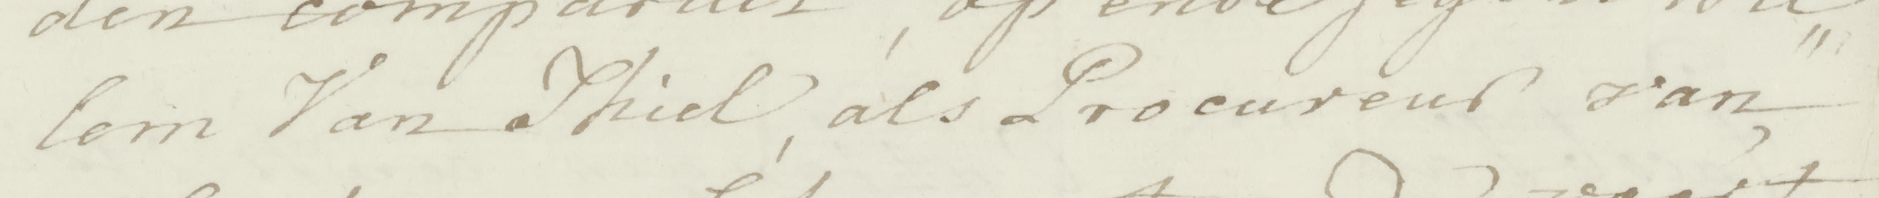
lem van Thiel, als Procureur van
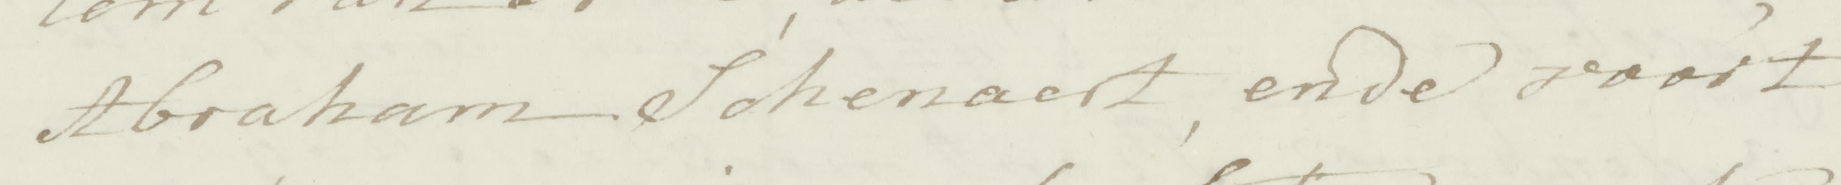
Abraham Schenaert, ende voort
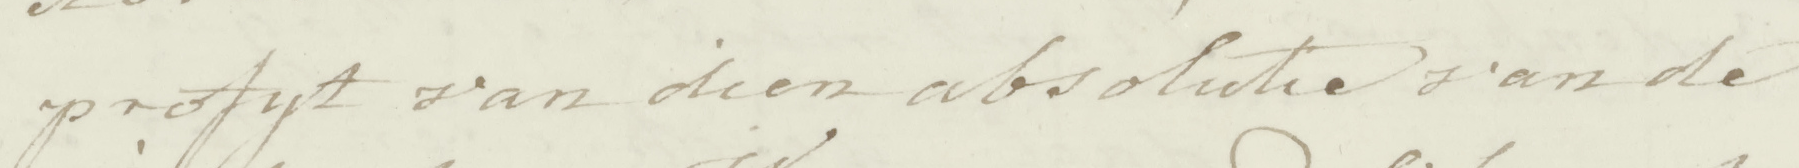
profijt van dien absolutie van de
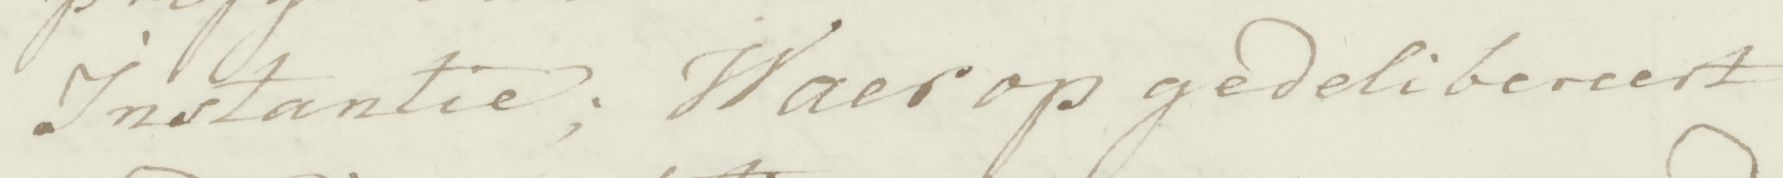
Instantie; Waer op gedelibereert
